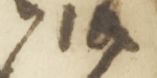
717
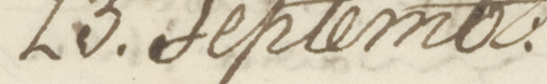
23. Septemb.
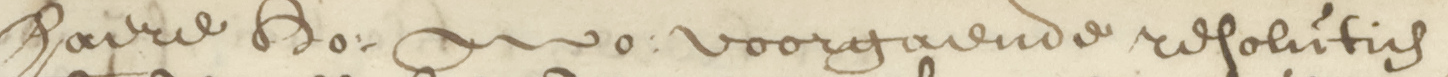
haere Ho:Mo: voorgaende resolutien,
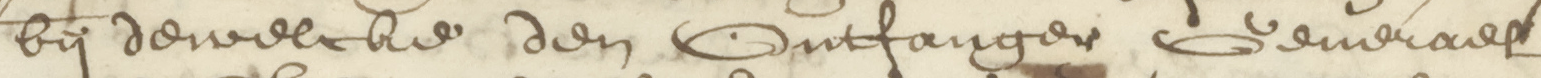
bij denwelcke den Ontfanger Generael
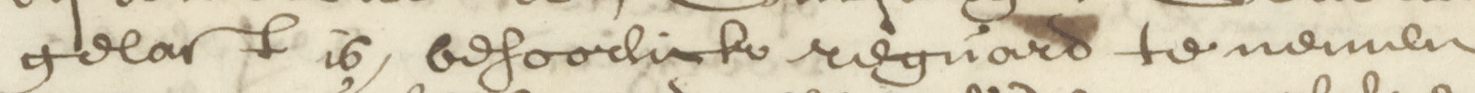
gelast is, behoorlick reguard te nemen
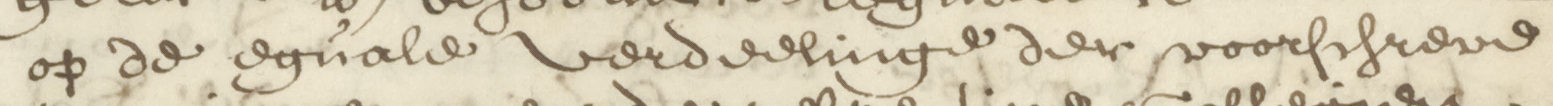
op de eguale verdeelinge der voorschreve
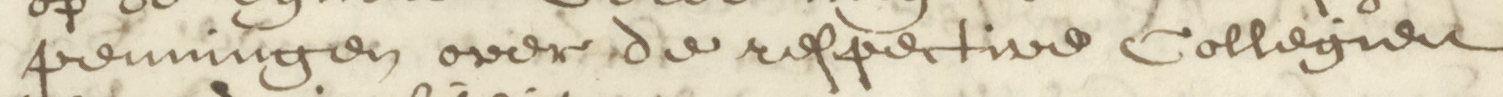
penningen over de respective Collegien
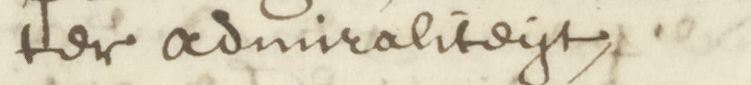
ter admiraliteijt.
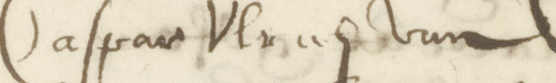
Caspar Ulrich van
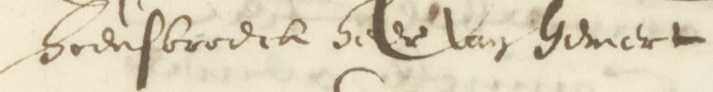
Hoensbroeck heer van Gemert
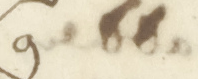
Ca
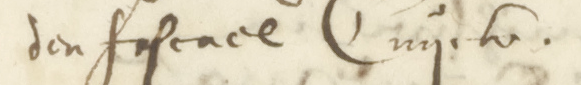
den fiscael Cuijck.
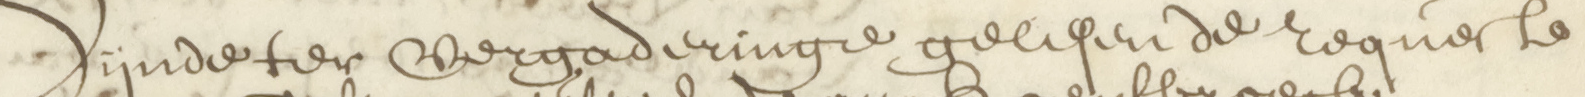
Sijnde ter Vergaderinge gelesen de requeste
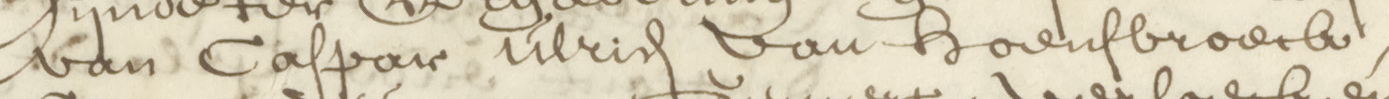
van Caspar Ulrich van Hoensbroeck
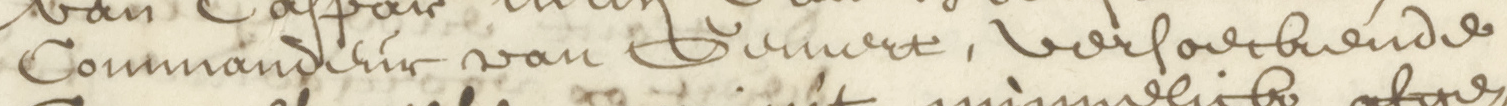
Commandeur van Gemert, versoeckende
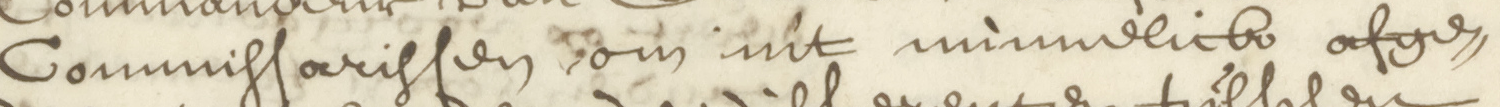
Commissarissen om int minnelick afge„
